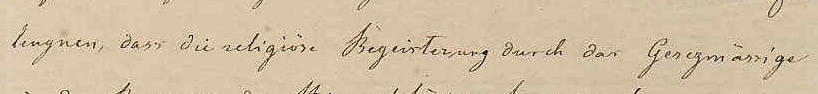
leugnen, dass die religiöse Begeisterung durch das Gesezmässige
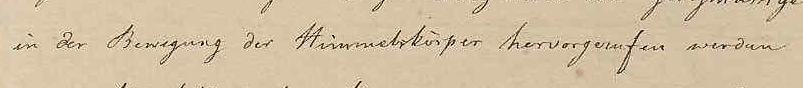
in der Bewegung der Himmelkörper hervorgerufen werden
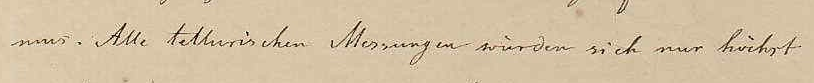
mus. Alle tellurischen Messungen würden sich nur höchst
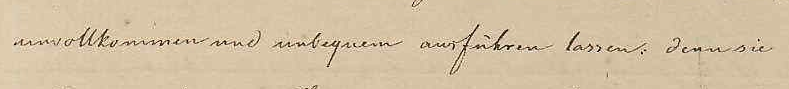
unvollkommen und unbequem ausführen lassen: denn sie
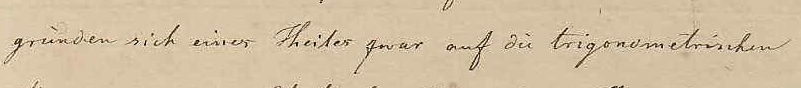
gründen sich eines Theiles zwar auf die trigonometrischen
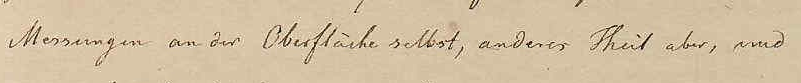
Messungen an der Oberfläche selbst, anderes aber, und
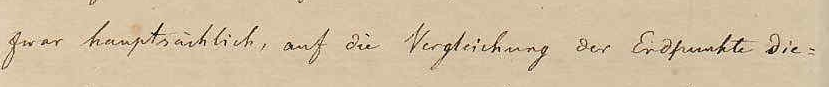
zwar hauptsächlich, auf die Vergleichung der Erdpunkte die-
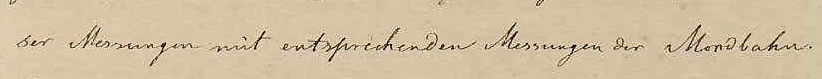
ser Messungen mit entsprechenden Messungen der Mondbahn.
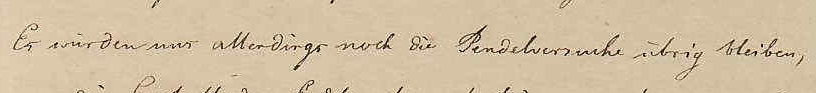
Es würden nur allerdings noch die Pendelversuche übrig bleiben,
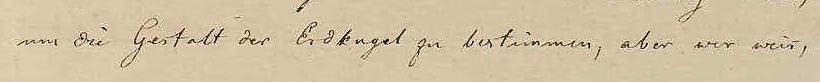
um die Gestalt der Erdkugel zu bestimmen, aber wer weis,
